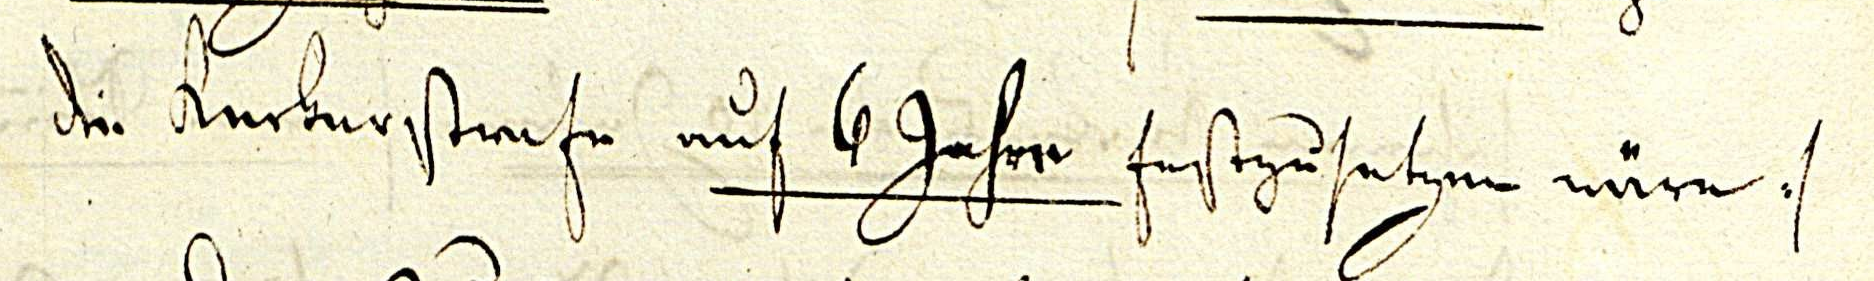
die Kerkerstrafe auf 6 Jahre festzusetzen wäre).
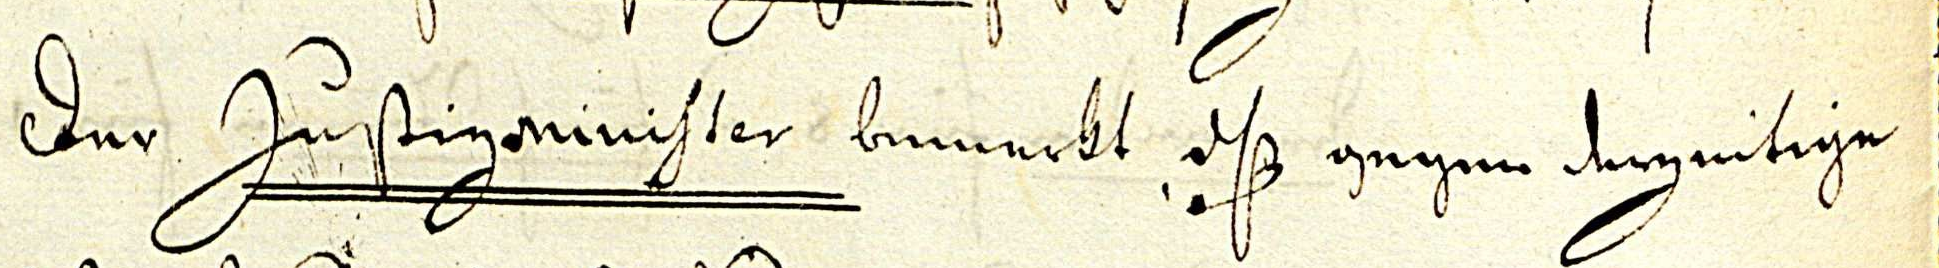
Der Justizminister bemerkt daß gegen derzeitige
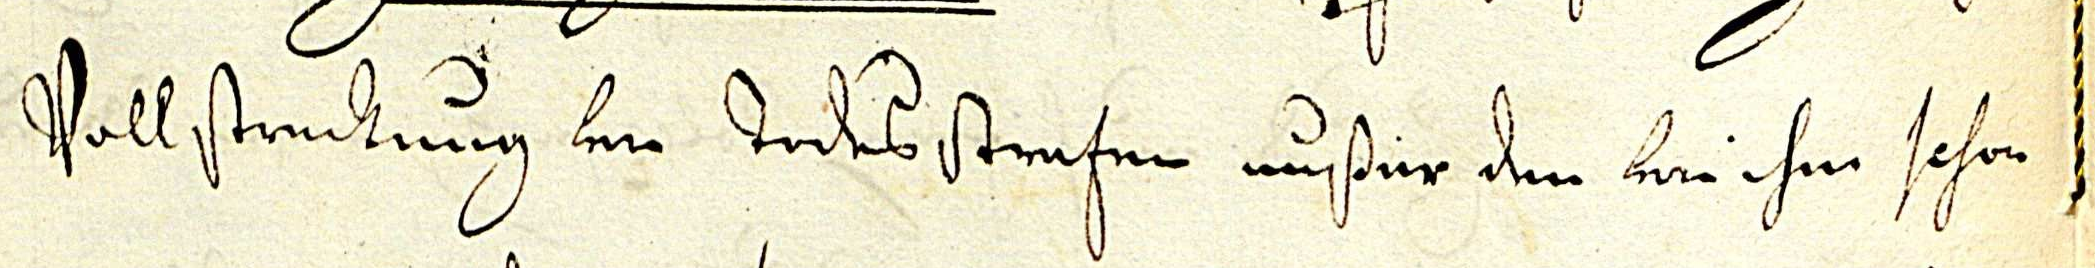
Vollstreckung von Todesstrafen außer den von ihm schon
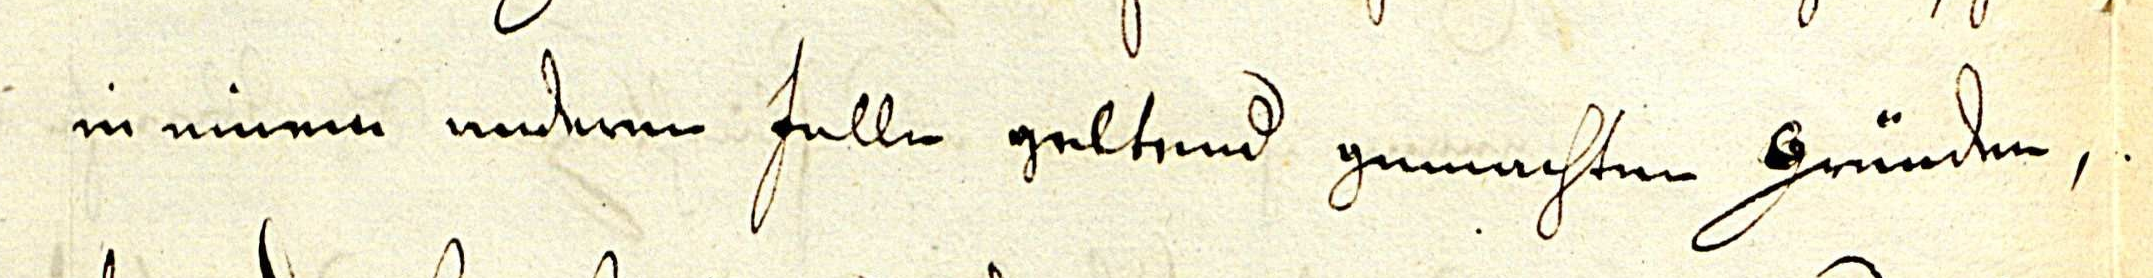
in einem anderen Falle geltend gemachten Gründen,
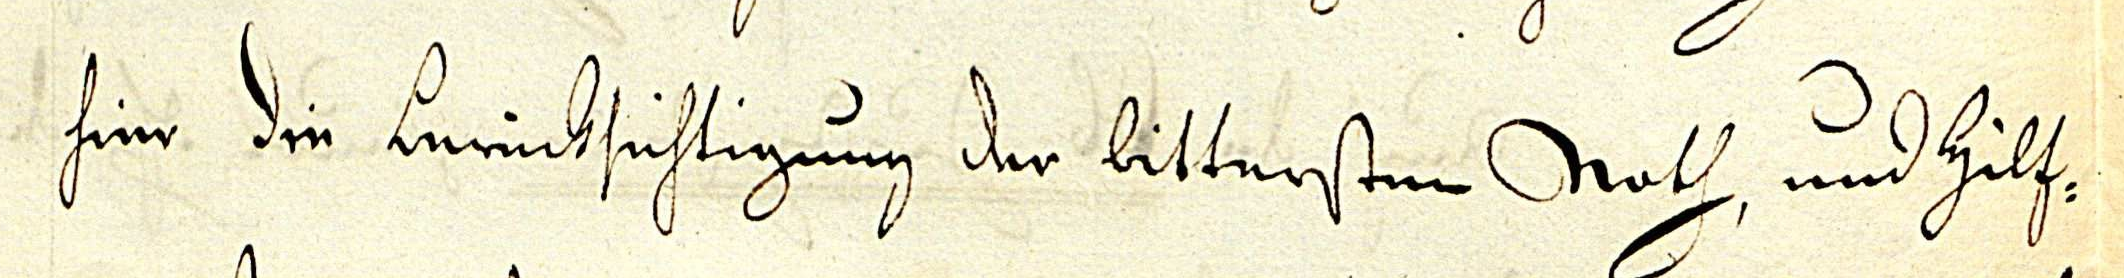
hier die Berücksichtigung der bittersten Noth, und Hilf¬
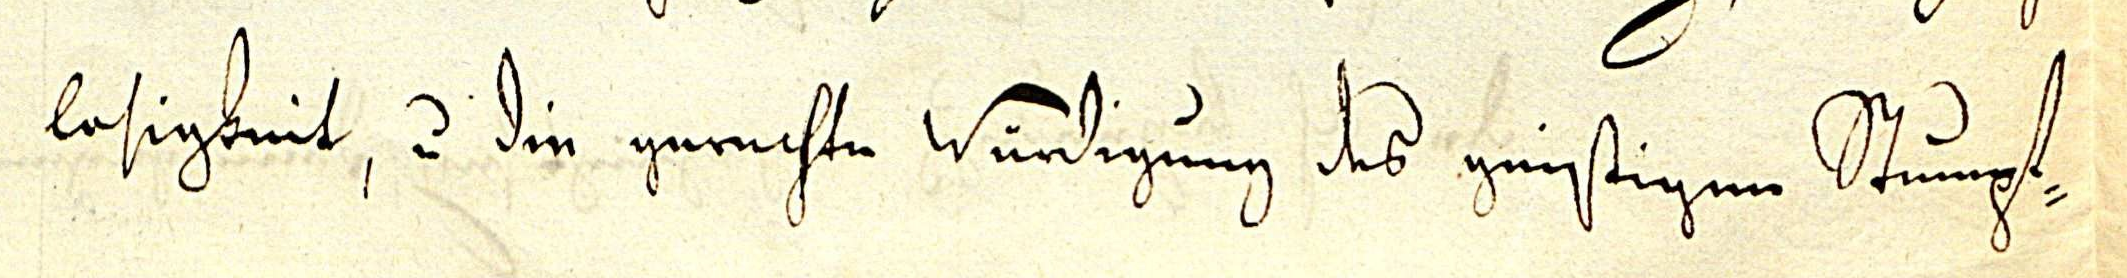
losigkeit, u. die gerechte Würdigung des geistigen Stumpf¬
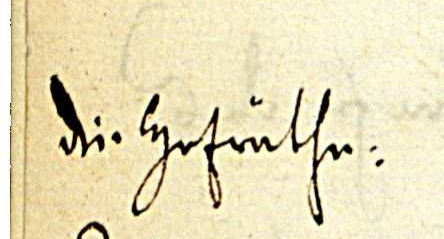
„Die Hofräthe:
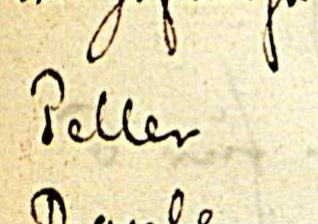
Peller,
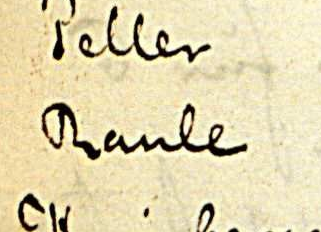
Raule,
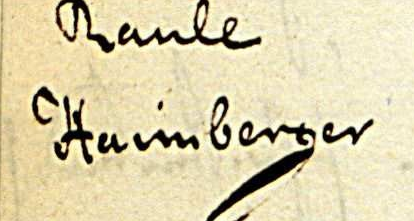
Haimberger
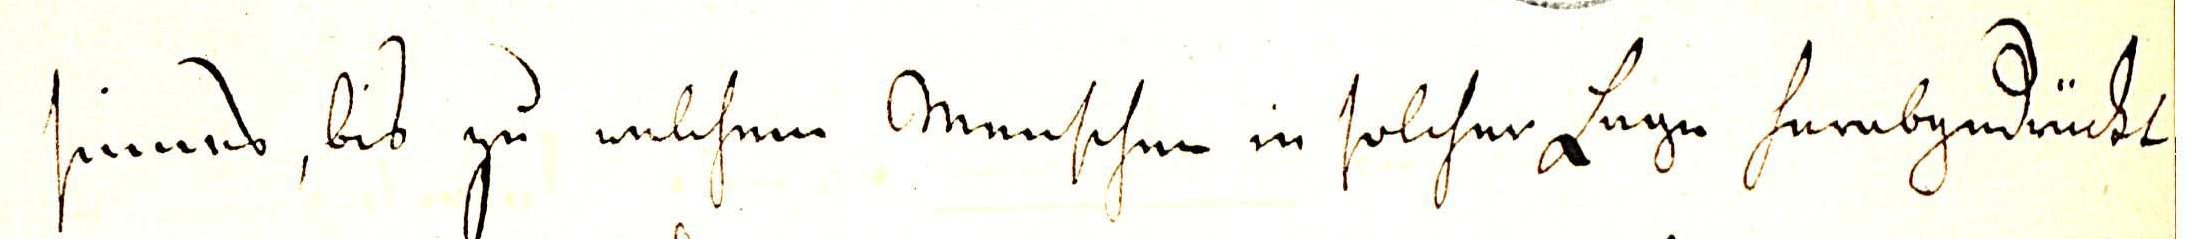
sinnes, bis zu welchem Menschen in solcher Lage herabgedrückt
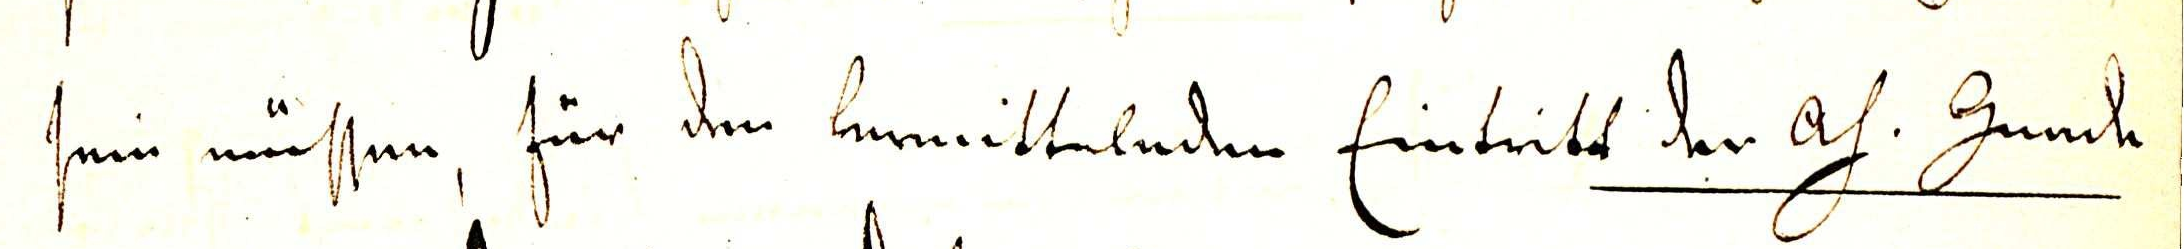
sein müssen, für den vermittelnden Eintritt der Ah. Gnade
